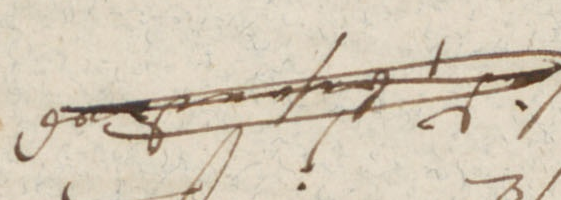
scheinen, legen
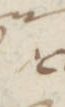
12
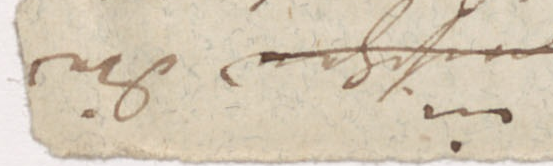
sind, besonders
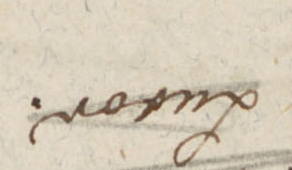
pharaonische Aegypten,
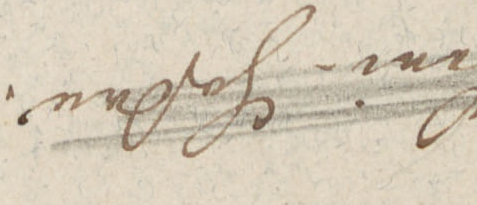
% Säule daher entweder
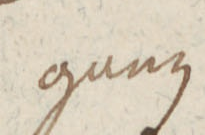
gleichzeitig
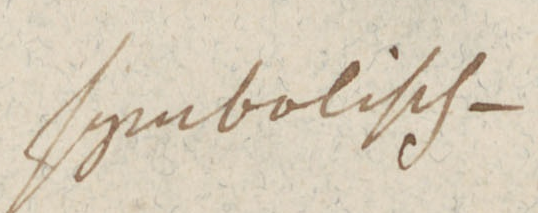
symbolisch-
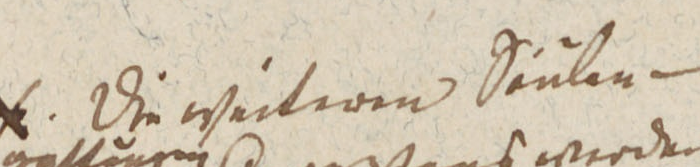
% Die weiteren Säulen-
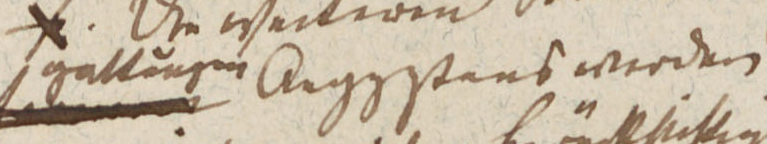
fgattungen Aegyptens werden
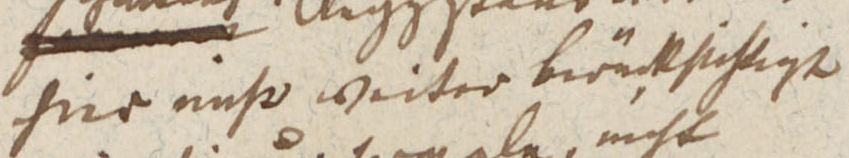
hier nicht weiter berücksichtigt
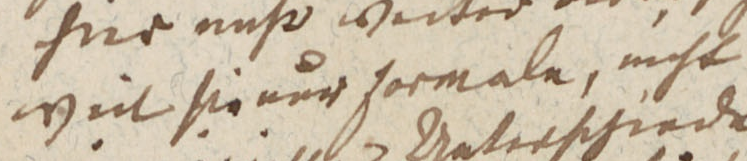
weil sie nur formale, nicht
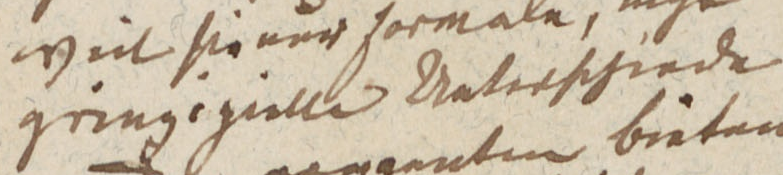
prinzipielle Unterschiede
